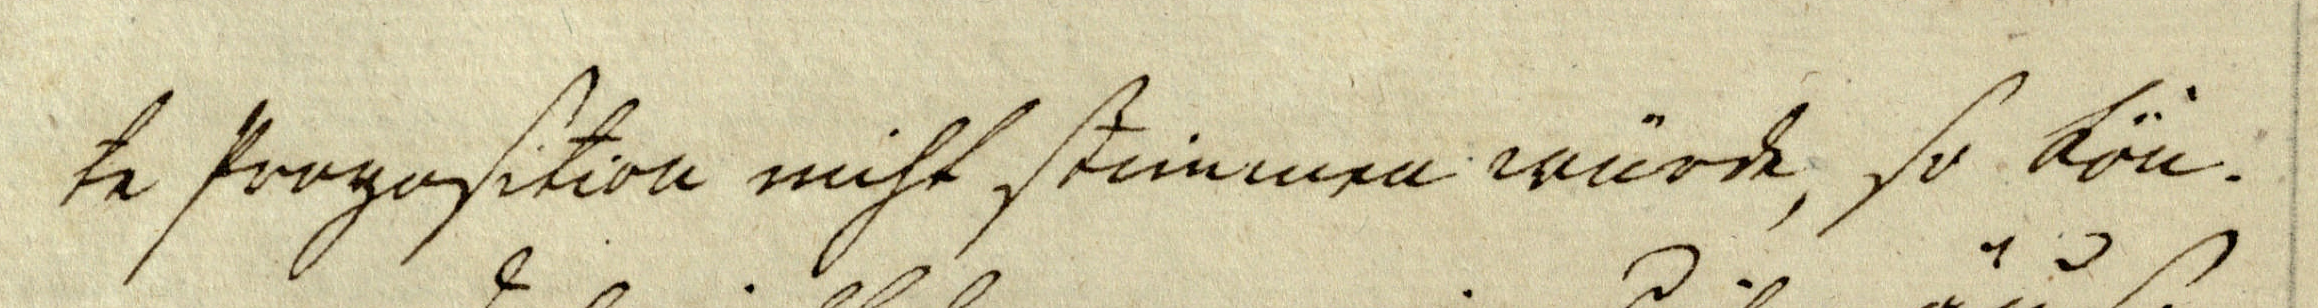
te Proposition nicht stimmen würde, so kön¬
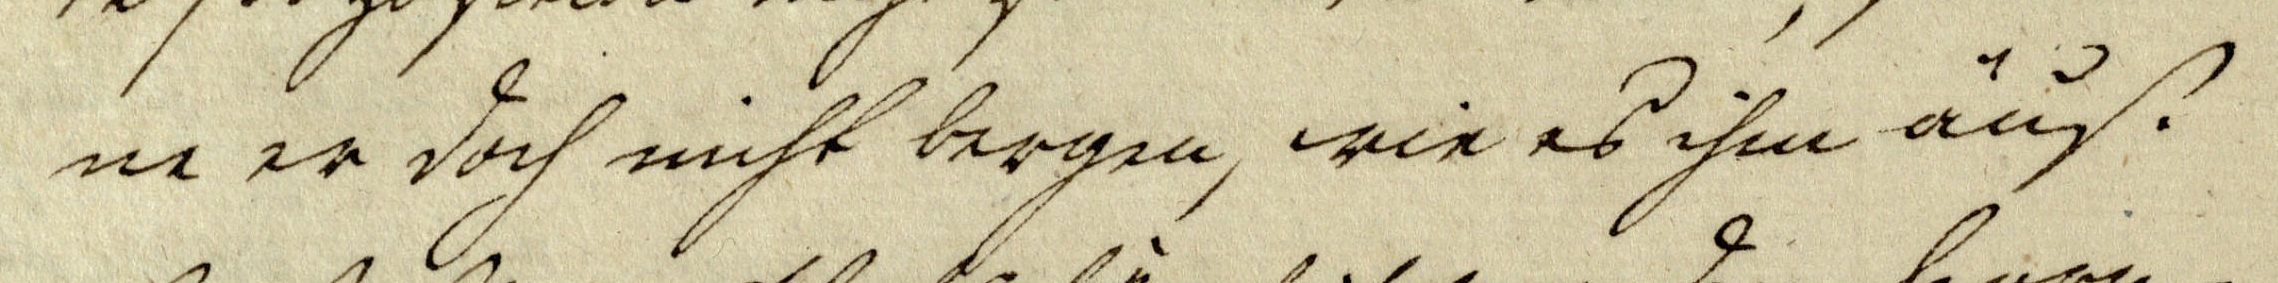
ne er doch nicht bergen, wie es ihm äus¬
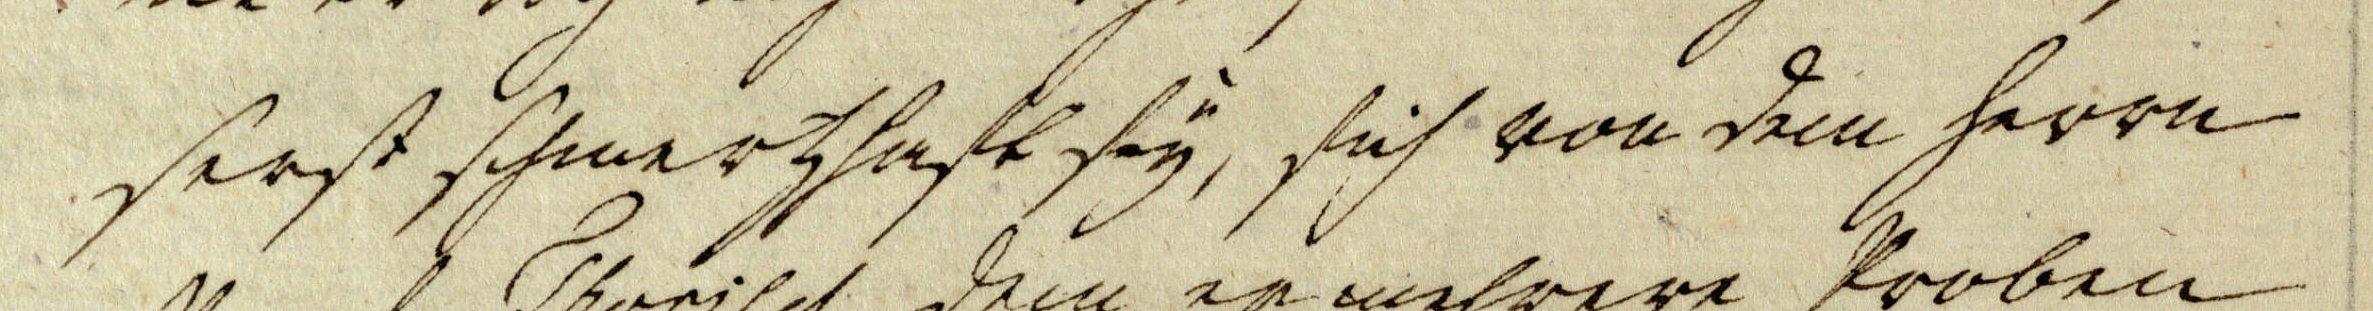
serst schmertzhaft seÿ, sich von dem Herrn
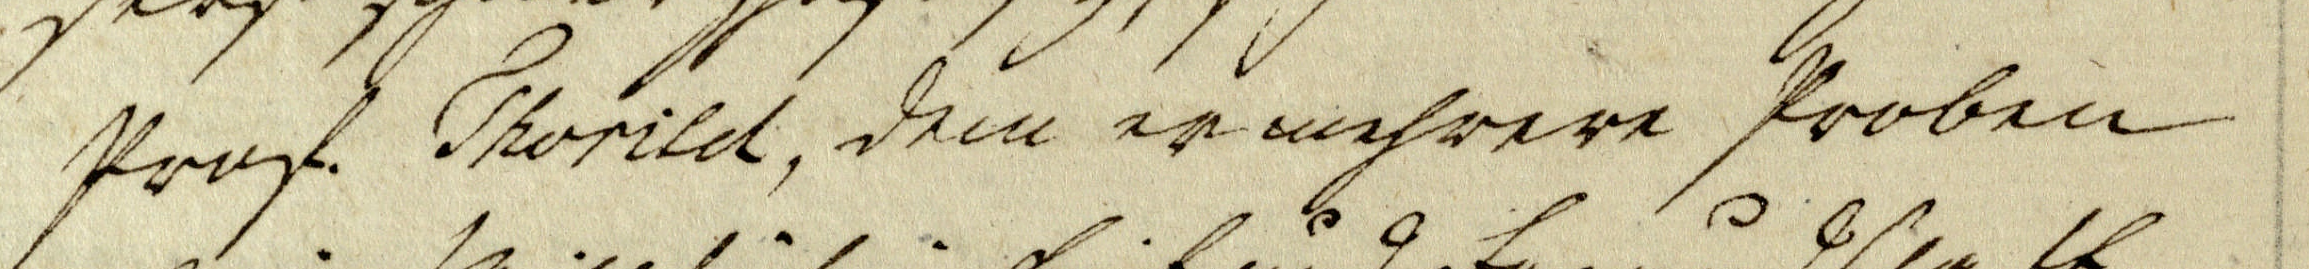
Prof. Thorild, dem er mehrere Proben
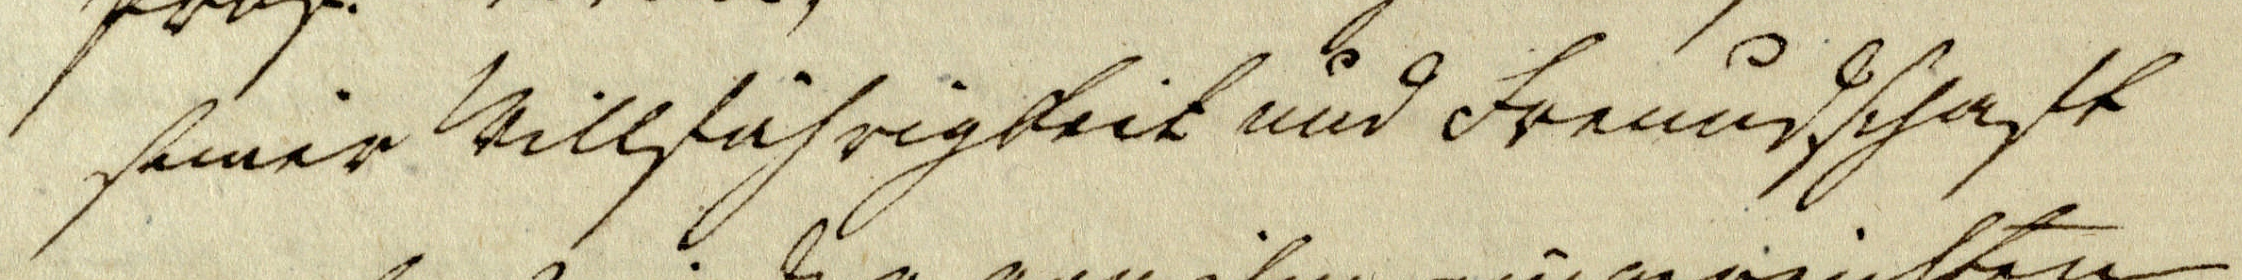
seiner Willfährigteit und Freundschaft
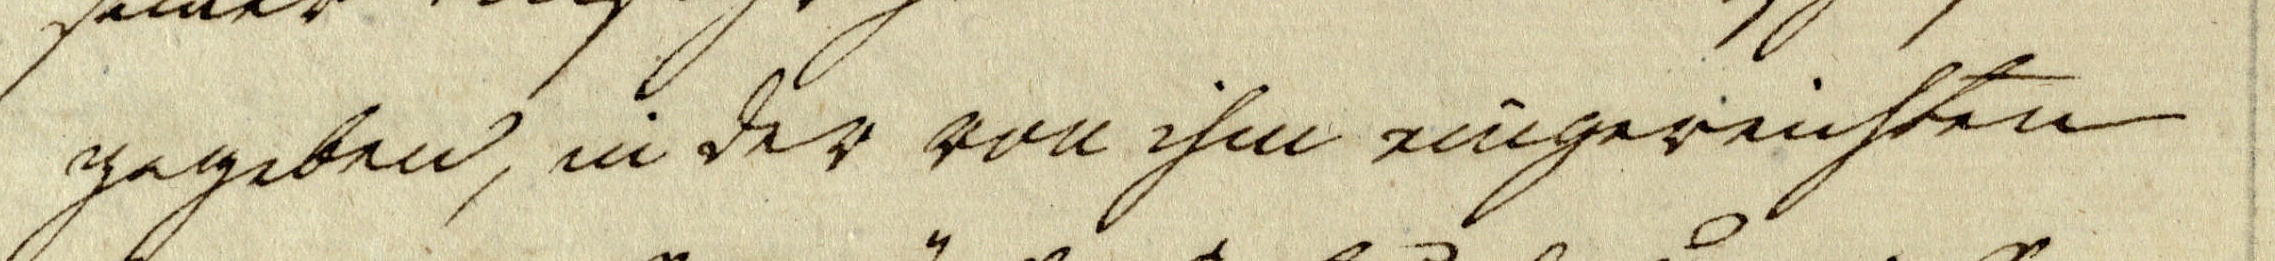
gegeben, in der von ihm eingereichten
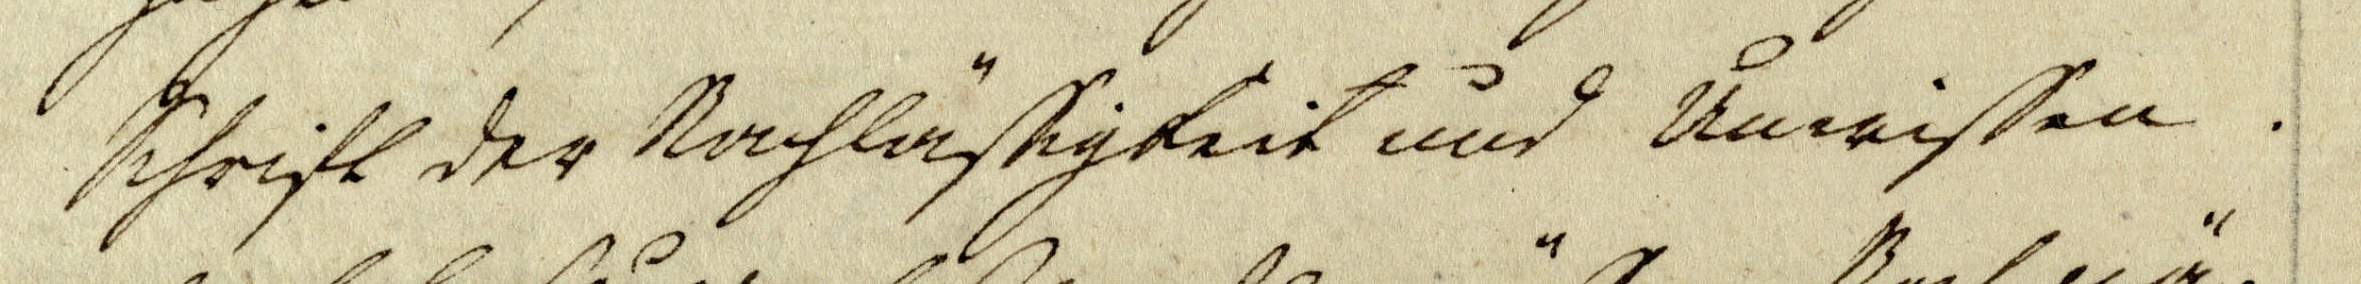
Schrift der Nachlässigkeit und Unwissen¬
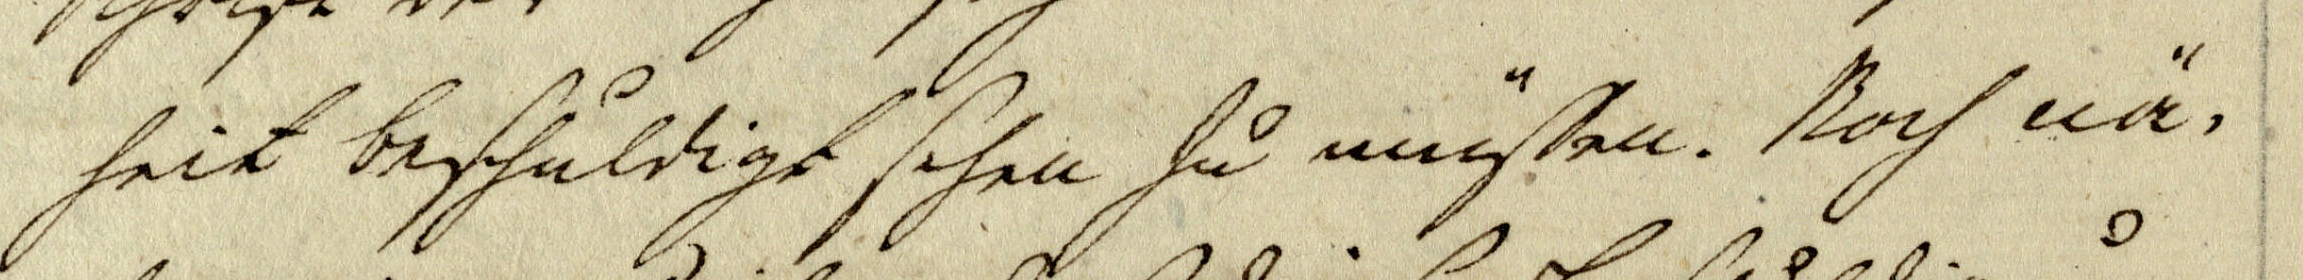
heit beschuldigt sehen zu müssen. Noch nä¬
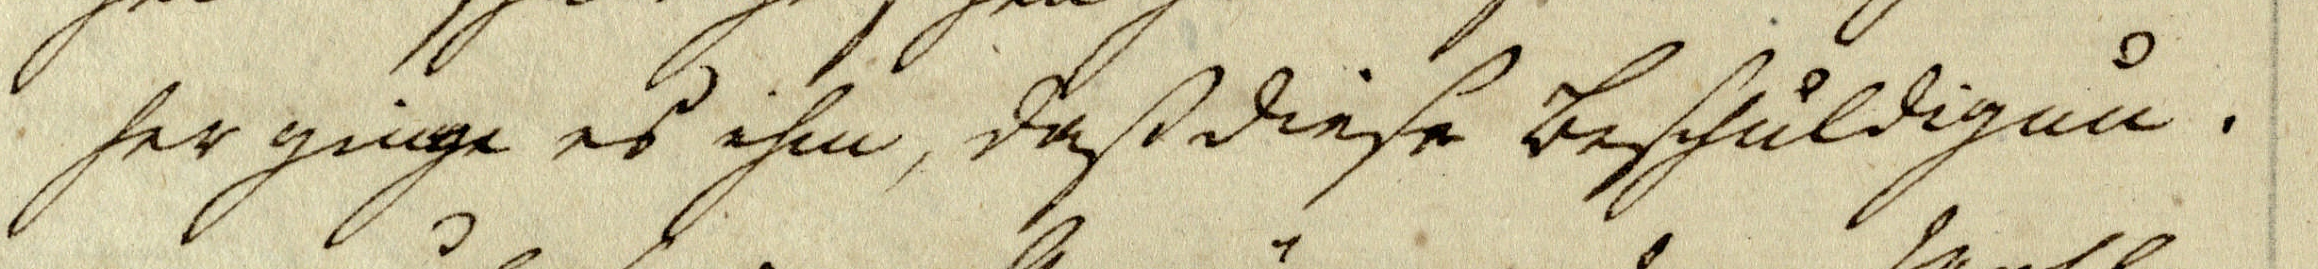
her ginge es ihm, daß diese Beschuldigun¬
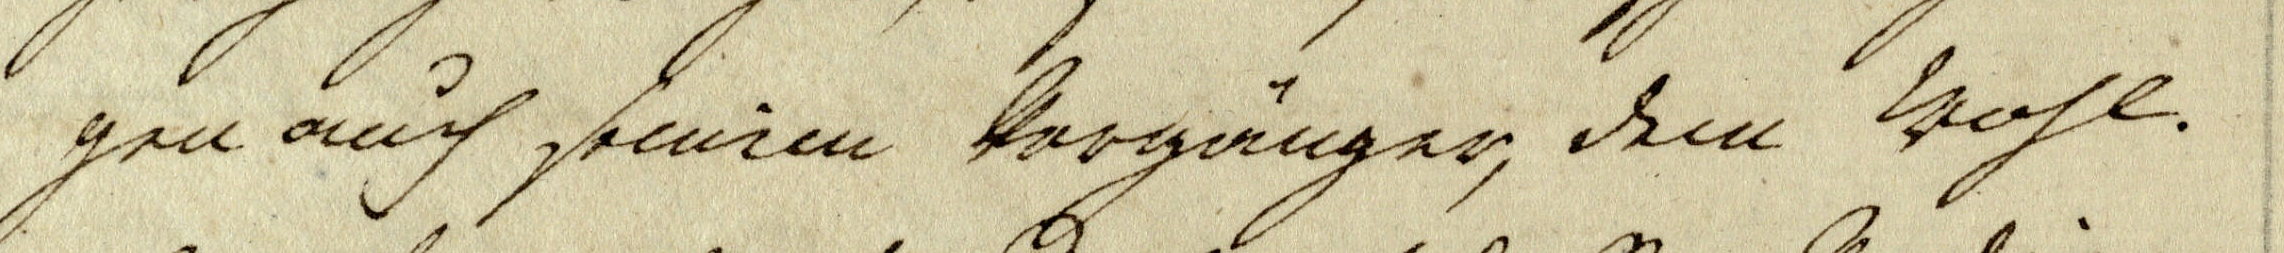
gen auch seinem Vorgänger, dem Wohl¬
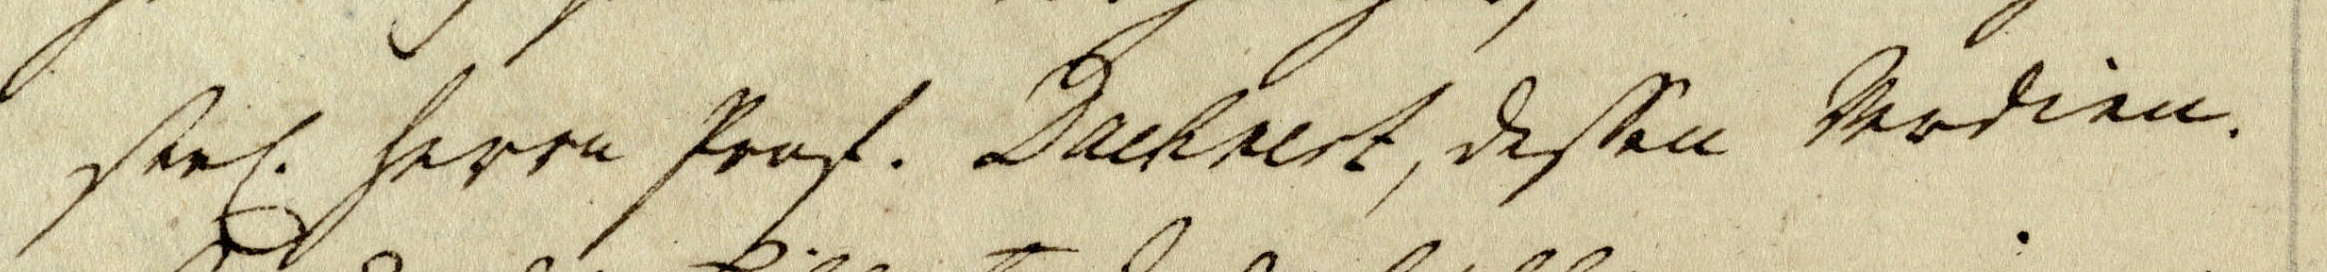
seel. Herrn Prof. Daehnert, dessen Verdien¬
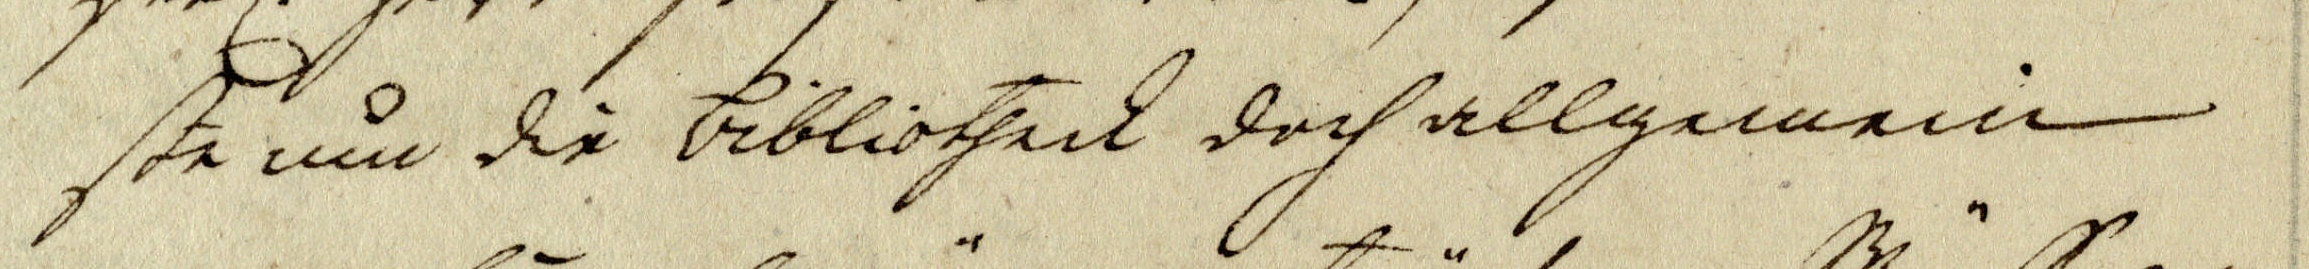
ste um die Bibliothek doch allgemein
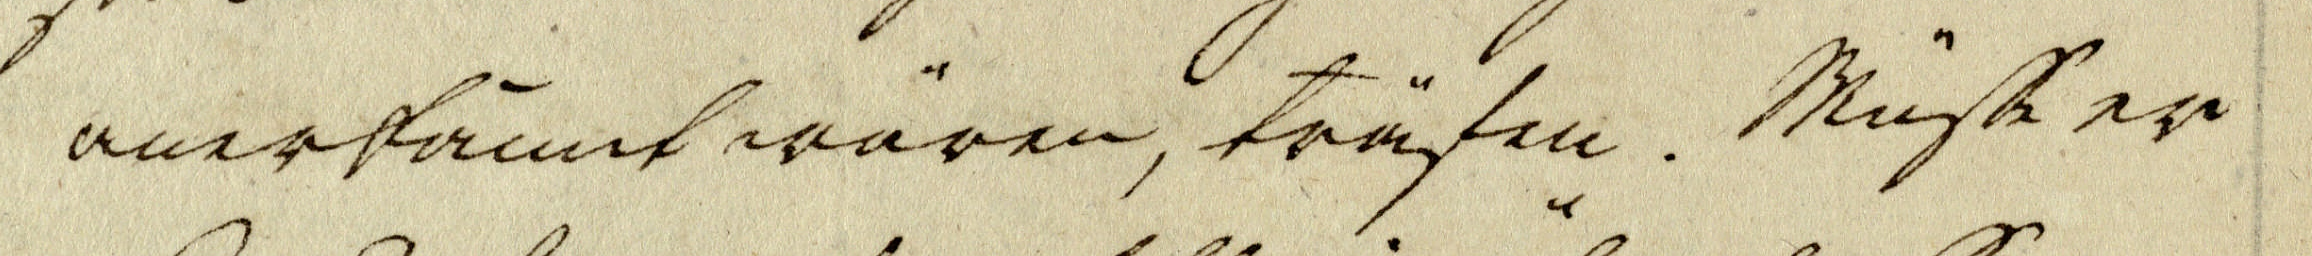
anerkannt wären, träfen. Müsse er
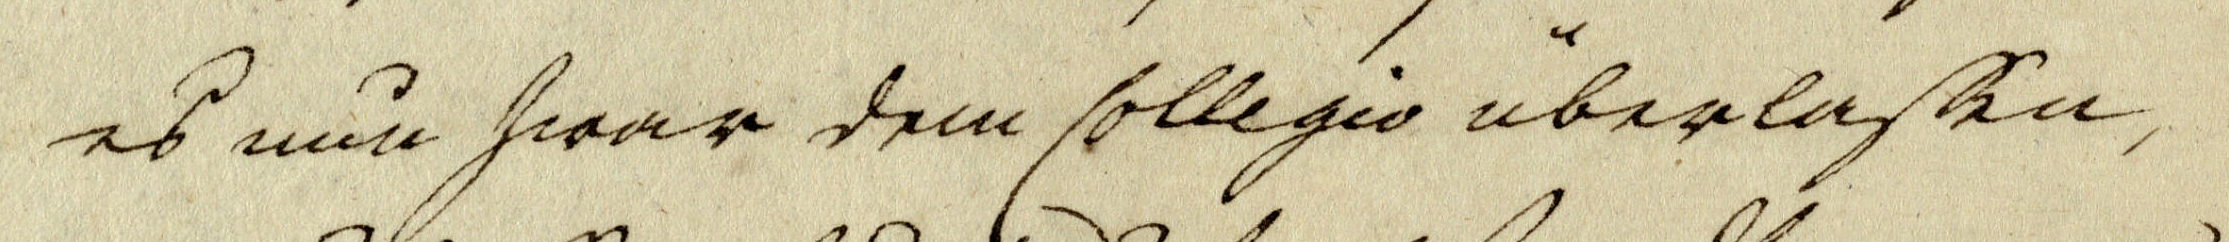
es nun zwar dem Collegio überlassen,
